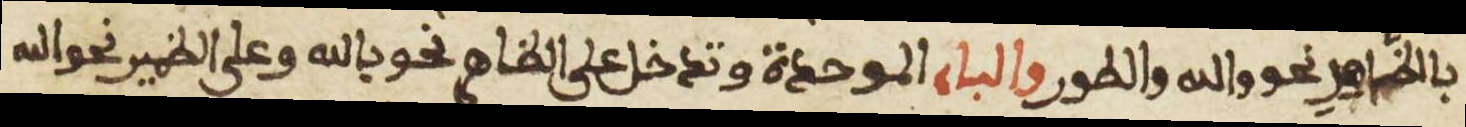بالظاهر نحو والله و الطور و الباء الموحدة و تدخل على الظاهر نحو بالله و على الظمير نحو الله
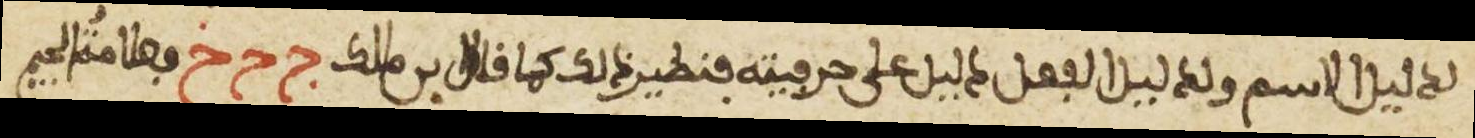لدليل الاسم و لدليل الفعل دليل على حرفيته فنظير ذلك كما قال بن مالك جحخ فعلامة الجيم
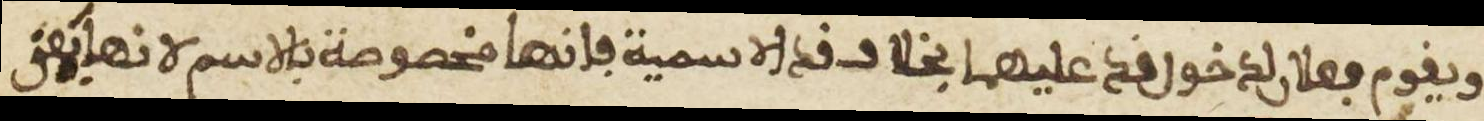و يقوم فعلان لدخول قد عليها بخلاف قد الاسمية فانها مخصوصة بالاسم لانها بمعنى
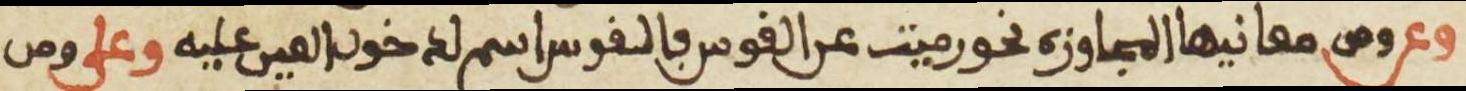و عن و من معانيها المجاورة نحو رميت عن القوس فالقوس اسم لدخول العين عليه و على من
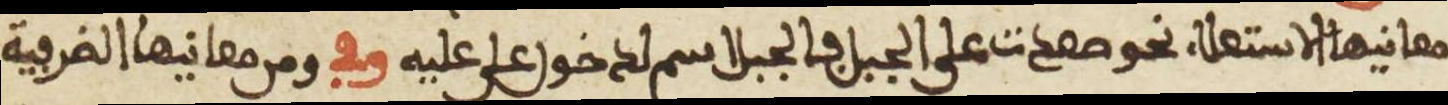معانيها الاستعلاء نحو صعدت على الجبل اسم لدخول على عليه و في و من معانيها الضرفية
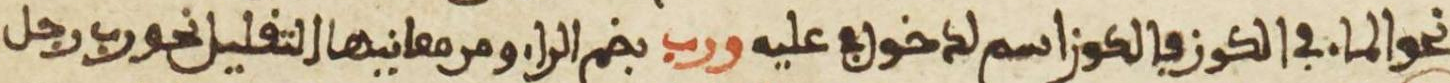نحو الماء في الكوز فالكوز اسم لدخول في عليه و رب بضم الراء و من معانيها التقليل نحو رب رجل
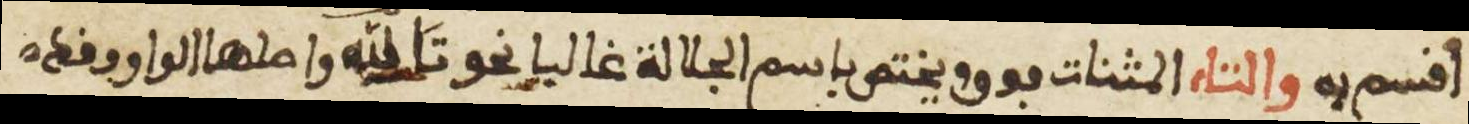اقسم به و التاء المثنات فوق و يختص باسم الجلالة غالبا نحو تالله و اصلها الواو و قد
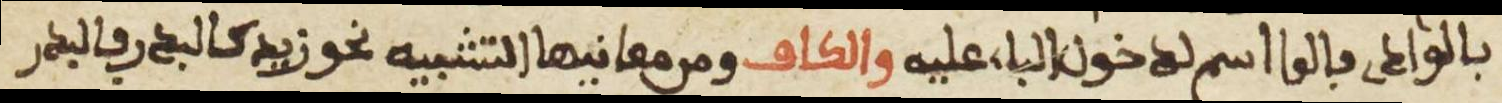بالوادى فالوا اسم لدخول الباء عليه و الكاف و من معانيها التشبيه نحو زيد كالبدر فالبدر
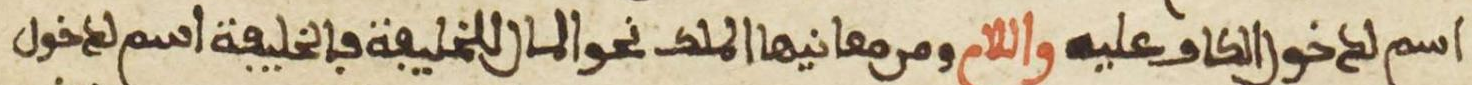اسم لدخول الكاف عليه و اللام و من معانيها الملك نحو المال للخليفة فالخليفة ابم لدخول
